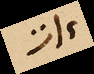ءات
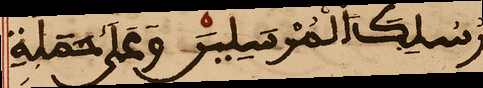رسلك المرسلين و على حملة
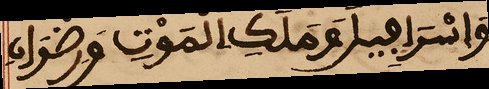و اسرافيل و ملك الموت و رضوان
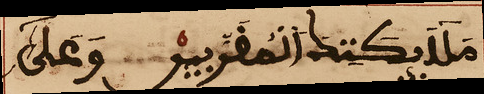ملائكتك المقربين و على
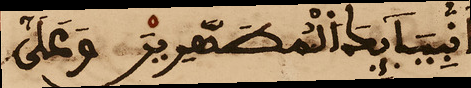أنبيائك المطهرين و على
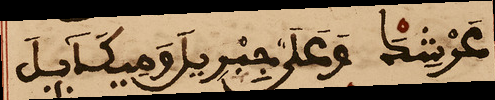عرشك و على جبريل و ميكائيل
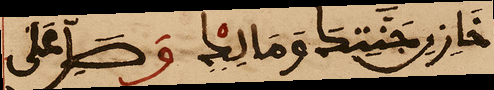خازن جنتك و مالك و صل على
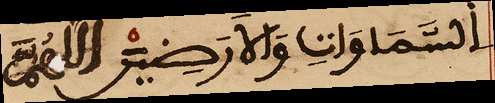السماوات والارضين اللهم
